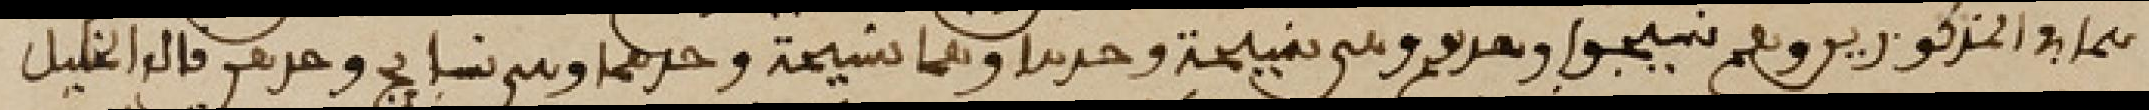بهما بعد المذكورين وهم نسجوا وبعدهم وهي نسيحة وحدها وهما نسيحة وحدها وهن نسايح وحدهن قال الخليل
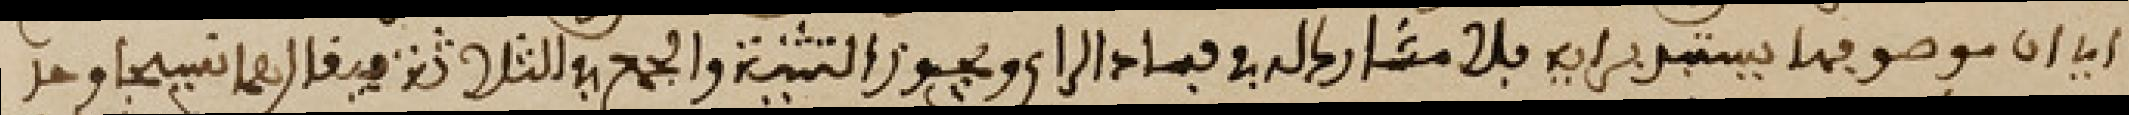ي ان موصوفها يستتر براية بلا مشارك له في بناء الراي ويجوز التثنية والجمع في الثلاثة فيقال هما تسبيحا ومر
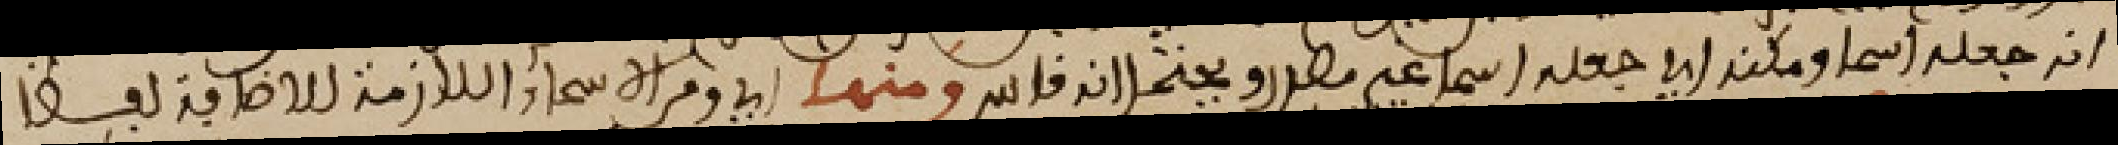انه جعله اسما و مكنه اي جعله اسما غير مصدر و يحتمل انه فاسد ومنها اي و من الاسماء اللازمة للاضافة لفظ
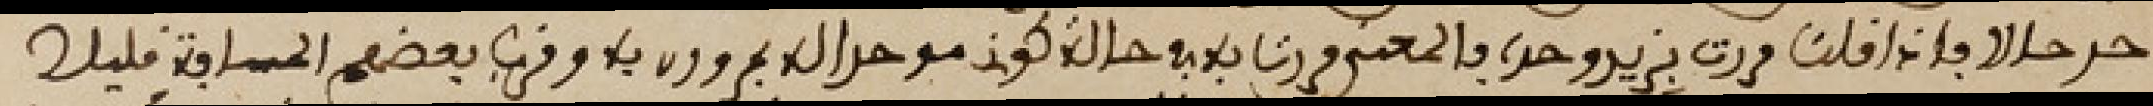حر حللا فاذا قلت قررت بزيد وحده بالمعنى قررت به في حالة كونه موحدا له بحروف يد و قرب بعضهم المسافة قليل
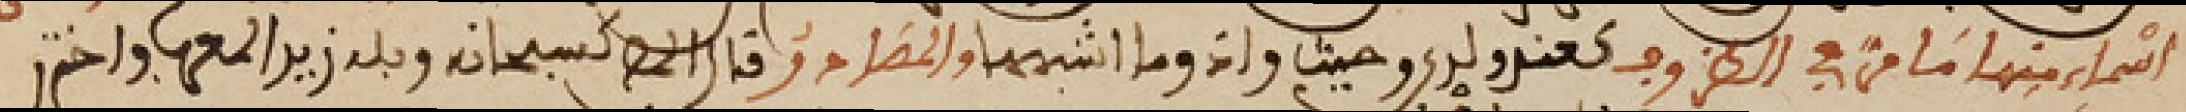اسماء منها من في الظروف كعندو لدي و حيث و اذا و ما اشبهها و المصادر قال المع كسبحانه و بلد زيدا لمعها و اختزر
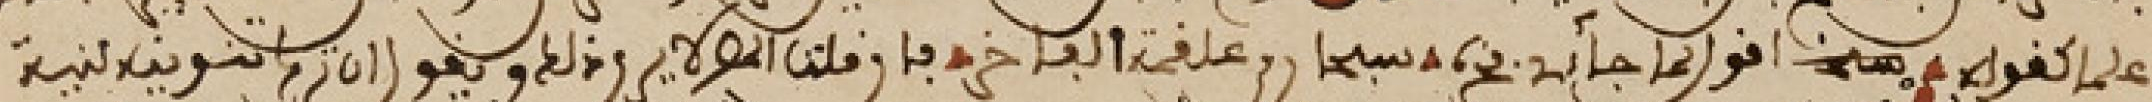على كقوله هذا قول لما جاء بذكره سبحا و من علقه الباخر بان قلت الا لا يرة و ذلك و يقول ان ترك تنوينه لنية
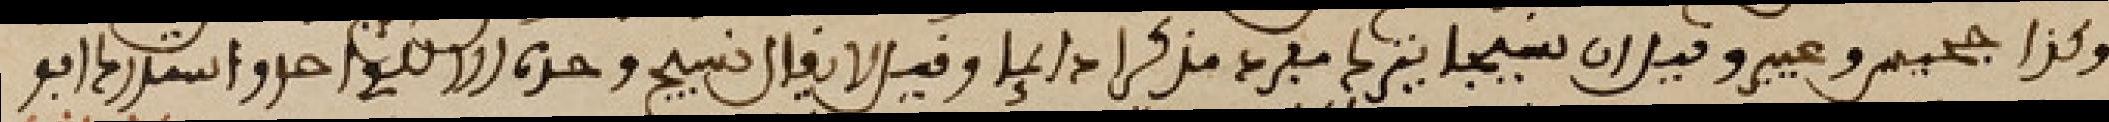وكذا جحيش وعير وقيل ان نسيج يترك مجرد مذكر دائما وقيل لا يقال نسيح وحده اللذين أخذوا استتروا دائما
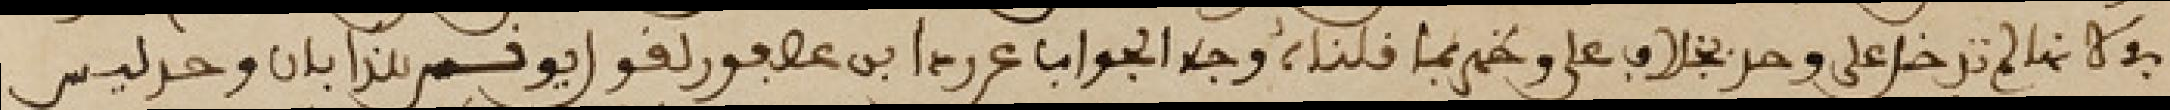في لانها لم تدخل على وجه بخلاف على و ظهر بما قلناه وجه الجواب عرودا بن عصفور لقول يونس هذا بان وحد ليس
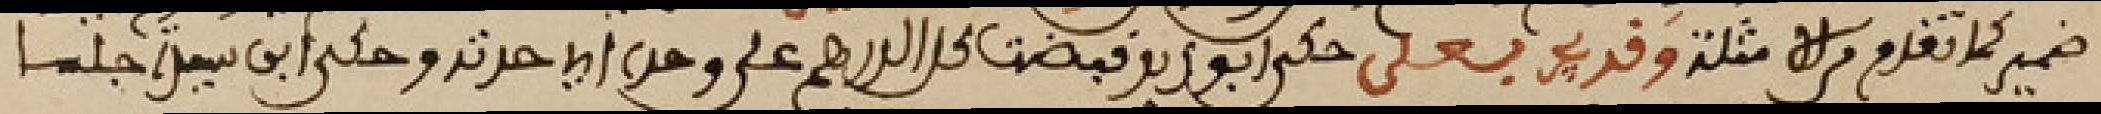ضمير كما تقدم مثله و قديم بعلل حكى ابو زيد قبضت كل الدرهم على وجه اي حدته و حكى ابن سيد جلسا
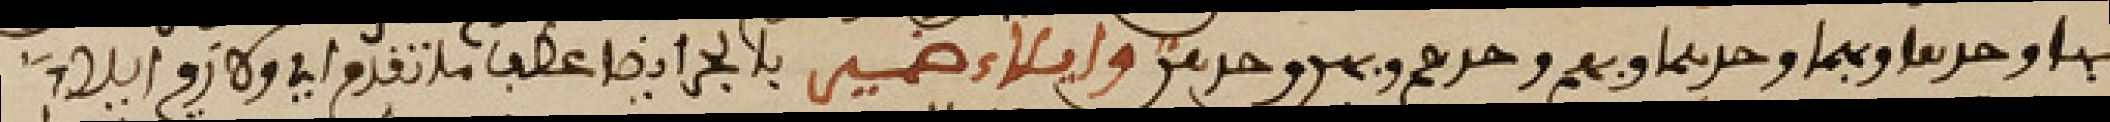بها و حدها وبما وجدهم و بهن وجدهم و ايلاء ضمير بالجر ايضا عطف ما تقدم اي ولازم ايلاء
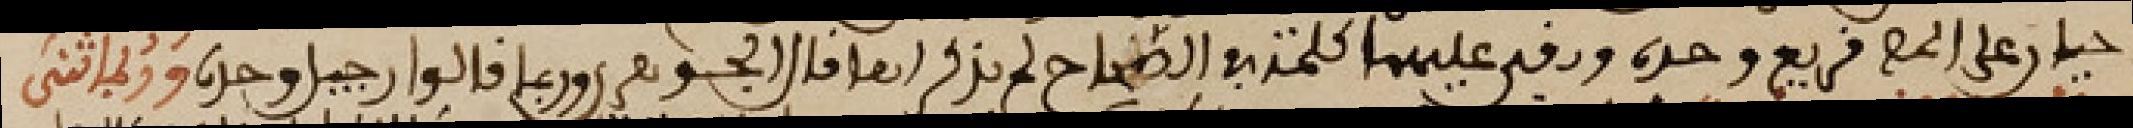حيان على المع قريع وحده وبقي عليهما كلمة في الصباح لم يذكر لها فقال الجوهر قالوا جيل وجرة وربما شىء مضاف
